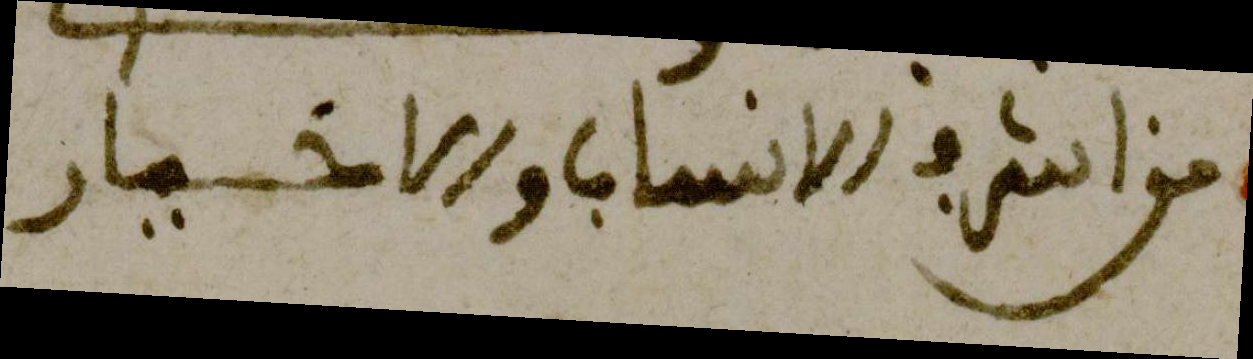من اشرف الانساب والاخيار
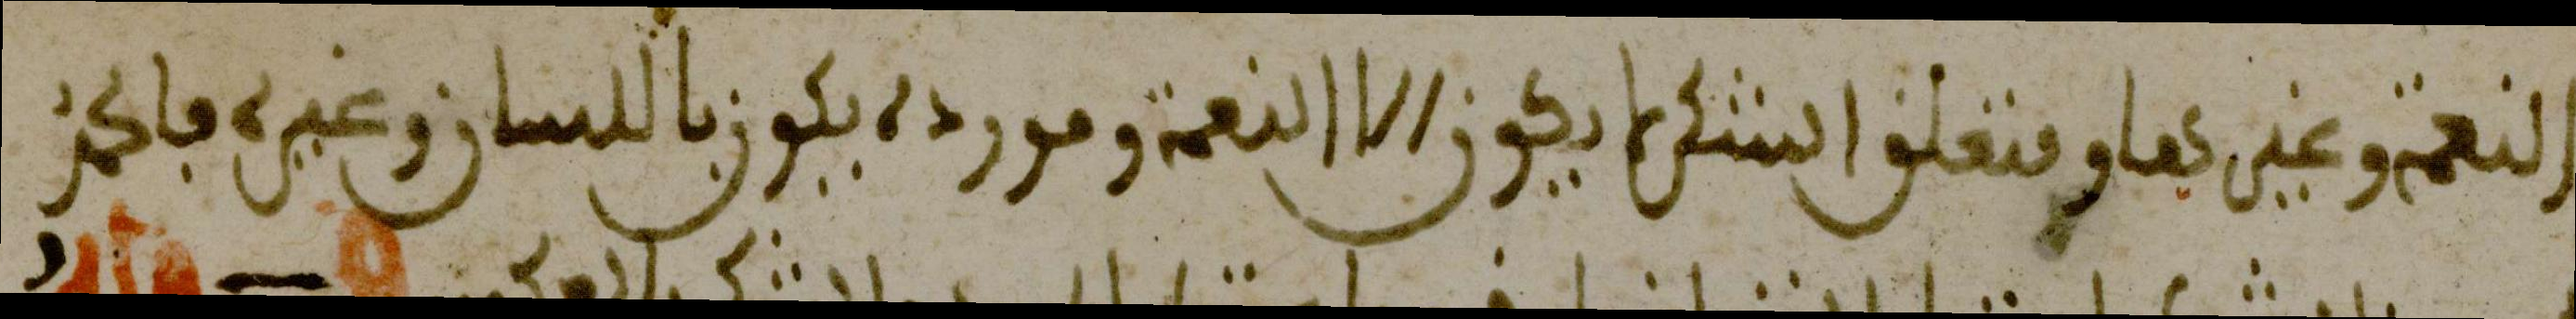النعمة غيرها ومتعلق الشكر لا يكون الا النعمة ومورده يكون بالسان وغيره فالحمد
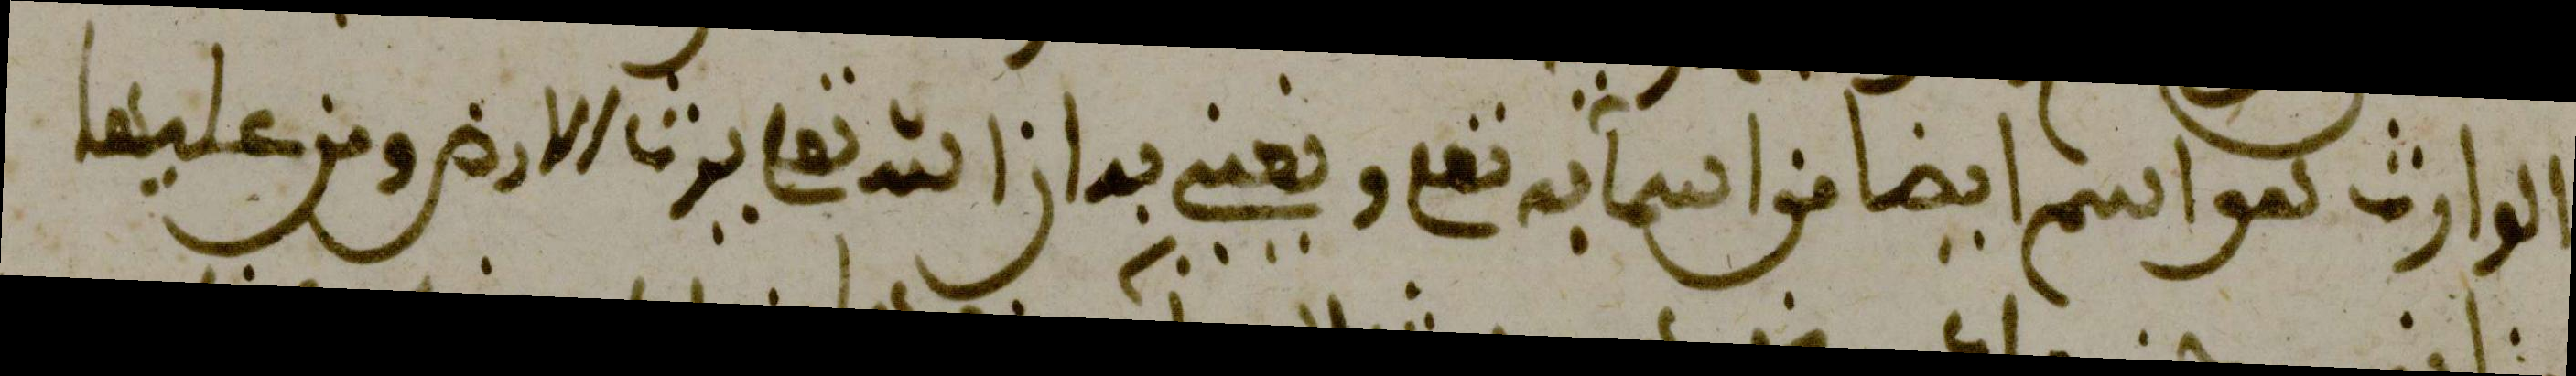الوارث هو اسم ايضا من اسمائه تعلى ويعني به ان الله تعلى يرث الارض ومن عليها
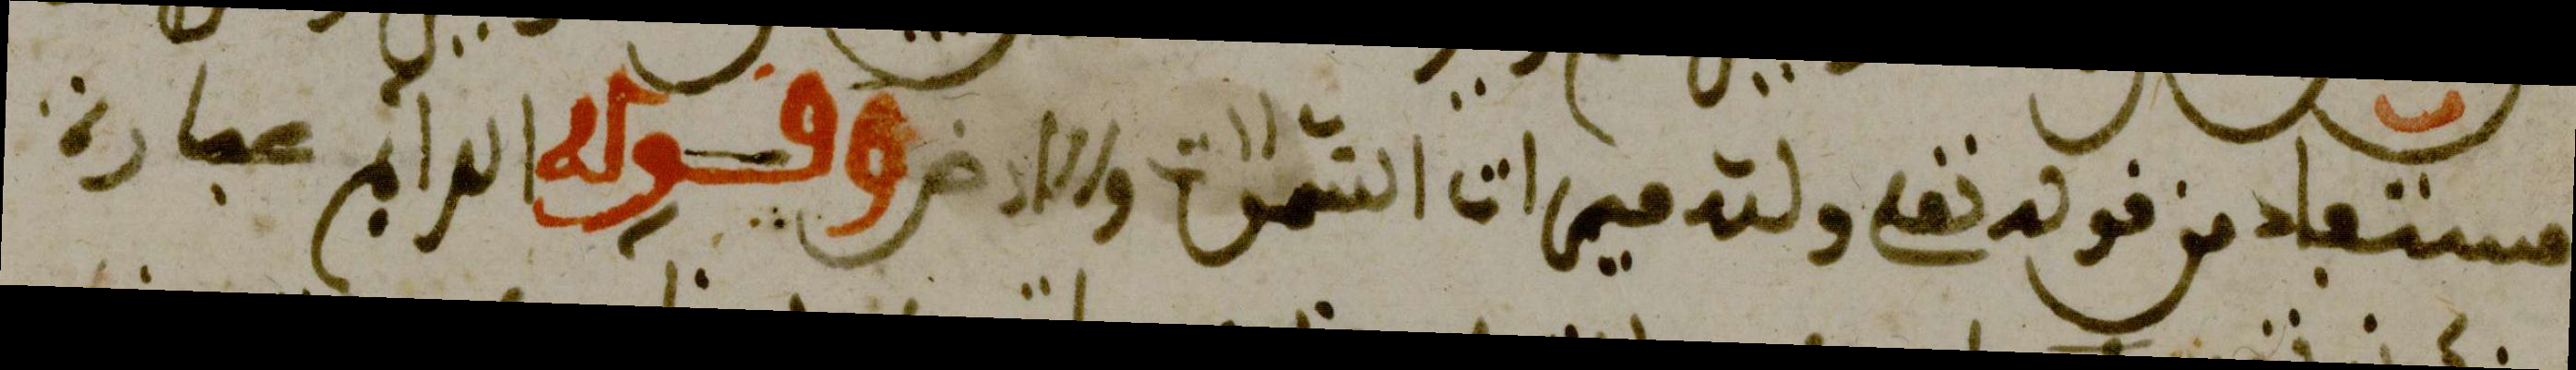مستفاد من قوله تعلى ولله ميرات السّموات والارض وقوله الداءم عبارة
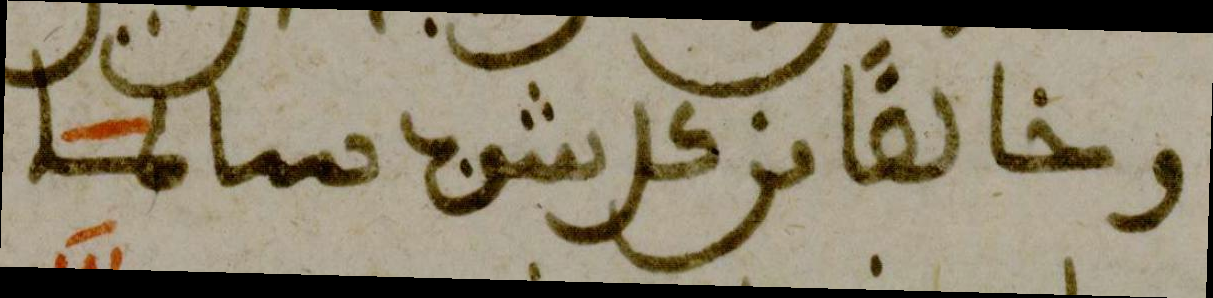وخالصًا من كل شوب سالما
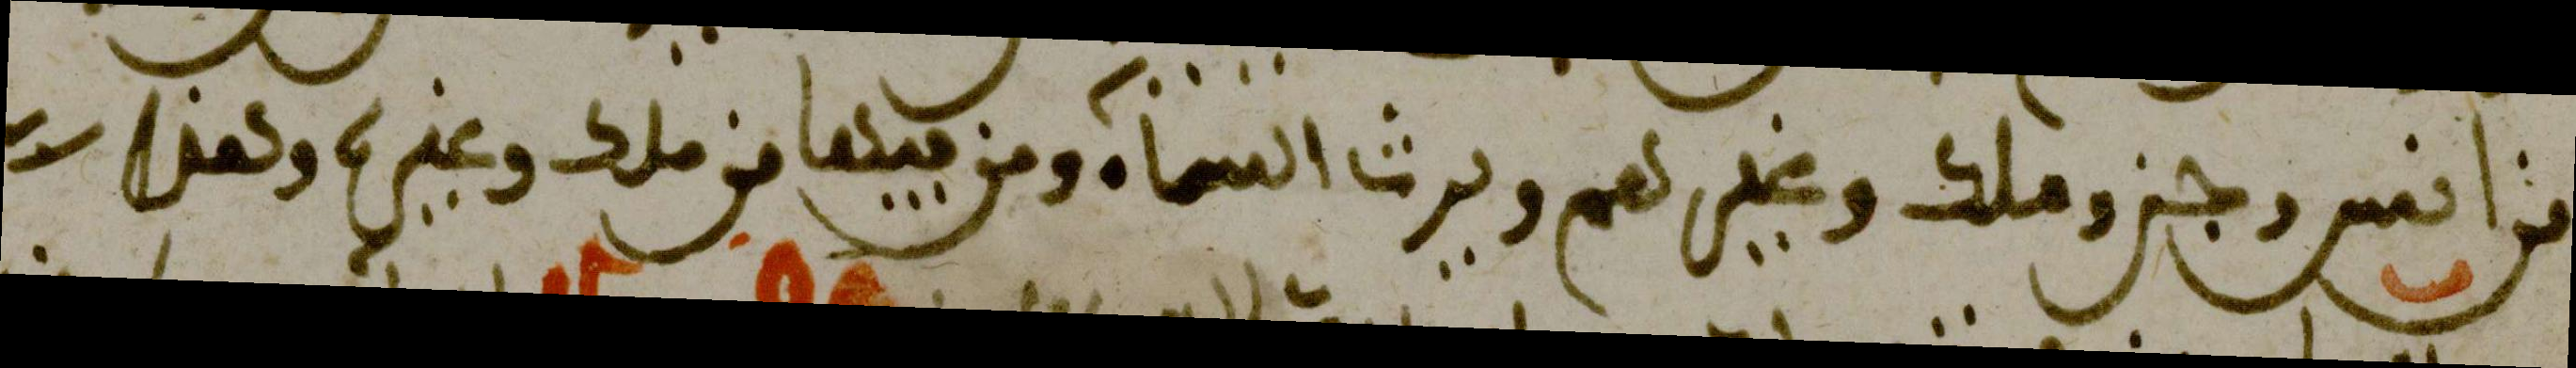من انس وجن وملك وغيرهم ويرث السماء ومن فيها من ملك وغيره وهذا
